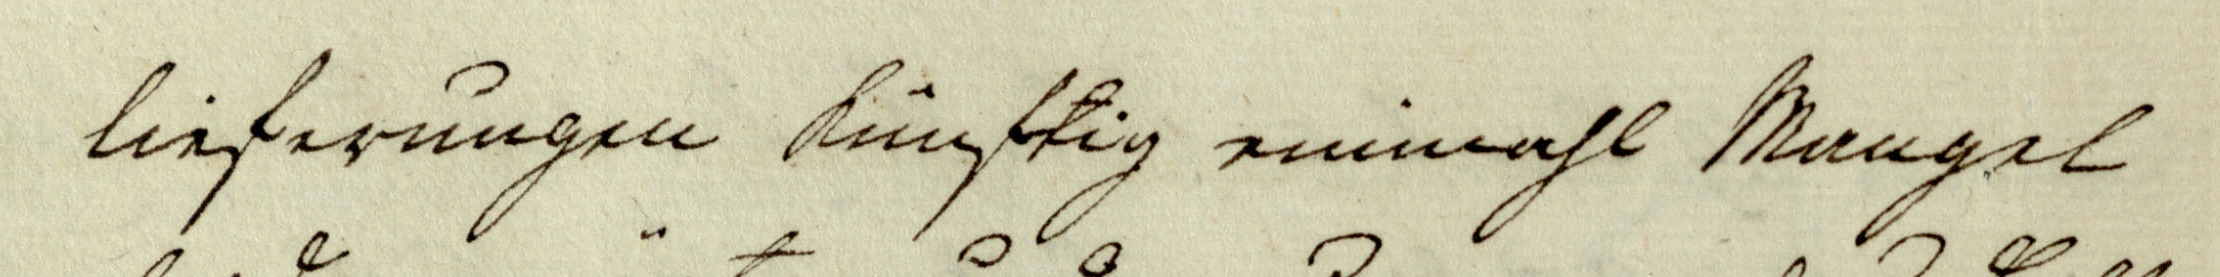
lieferungen künftig einmahl Mangel
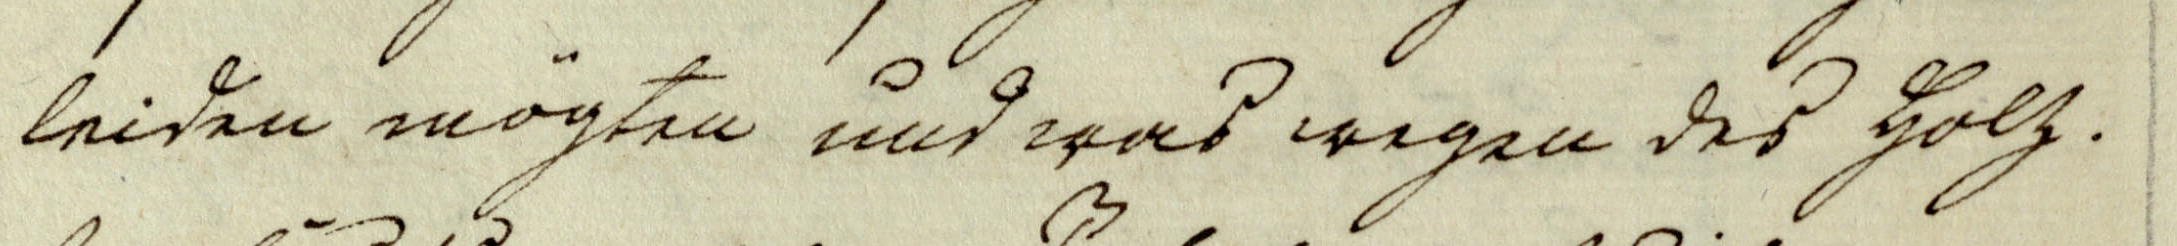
leiden mögten und was wegen des Holz¬
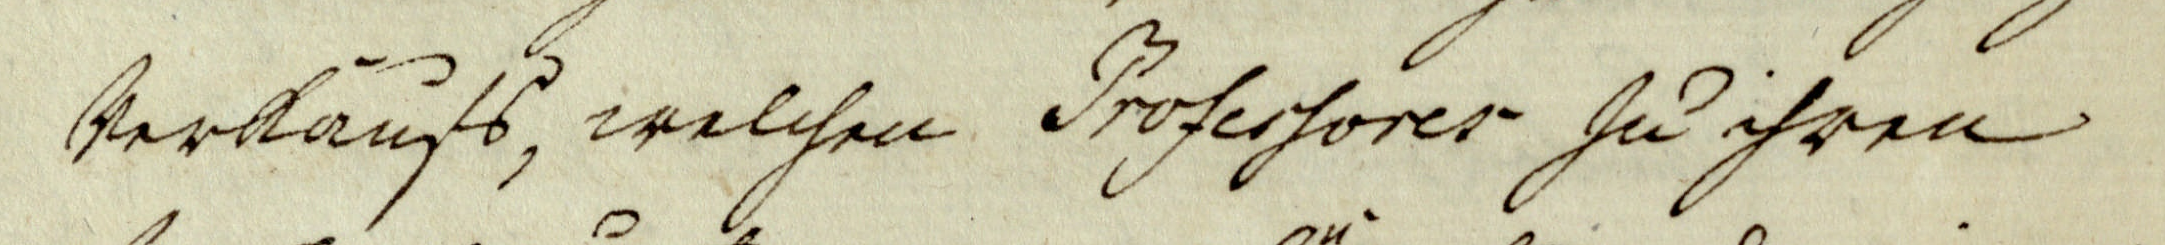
Verkaufs, welchen Professores zu ihren
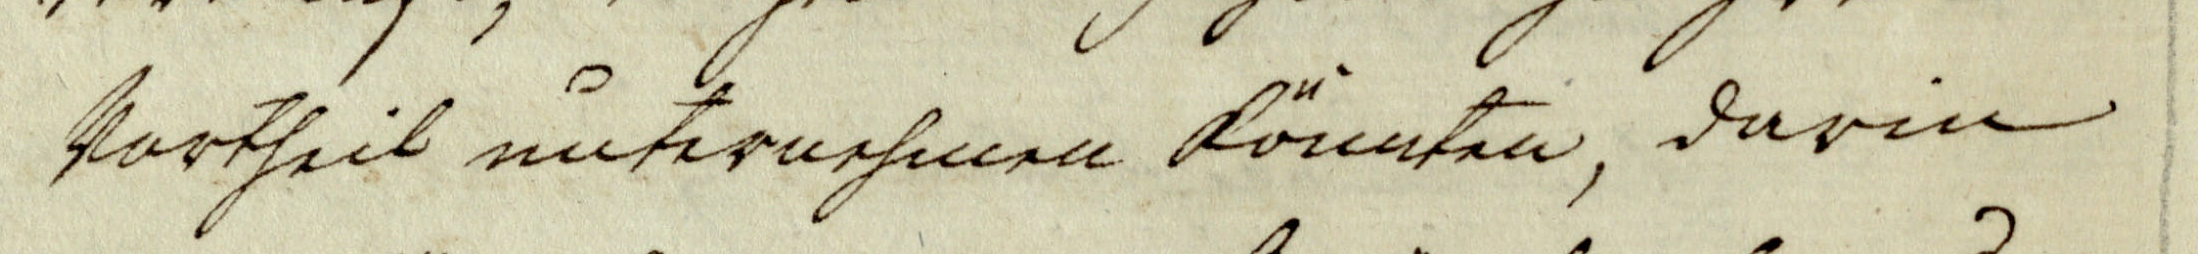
Vortheil unternehmen könnten, darin
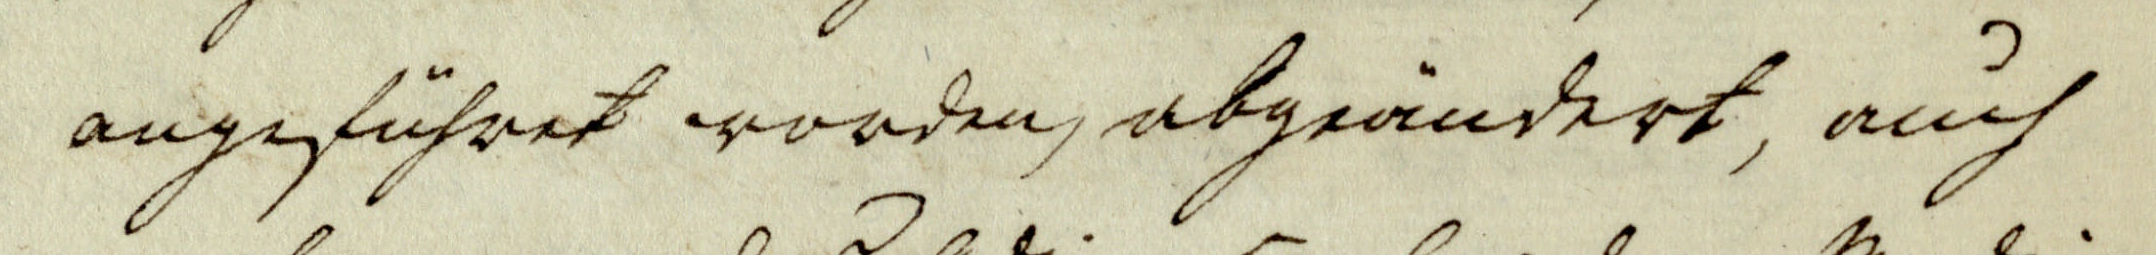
angeführet worden, abgeändert, auch
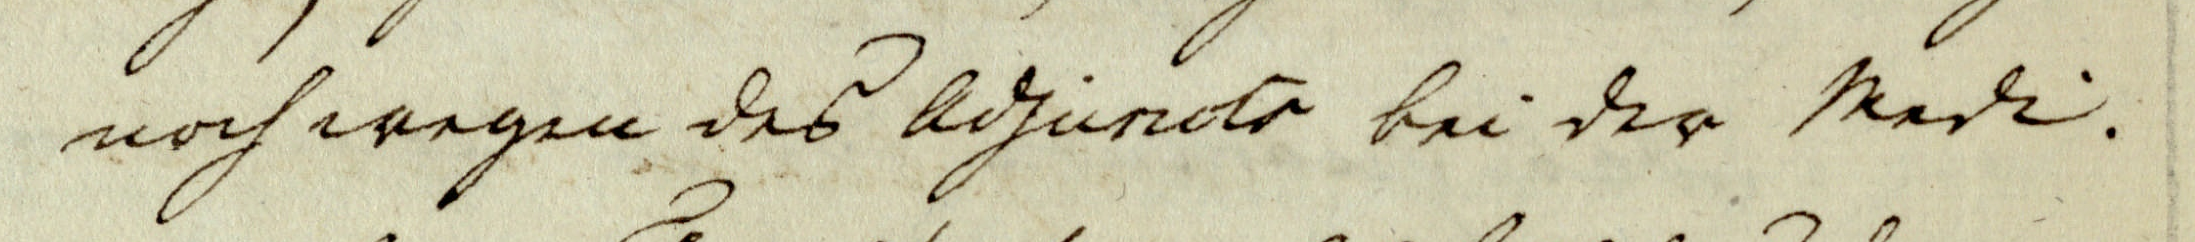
noch wegen des Adjuncts bei der Medi¬
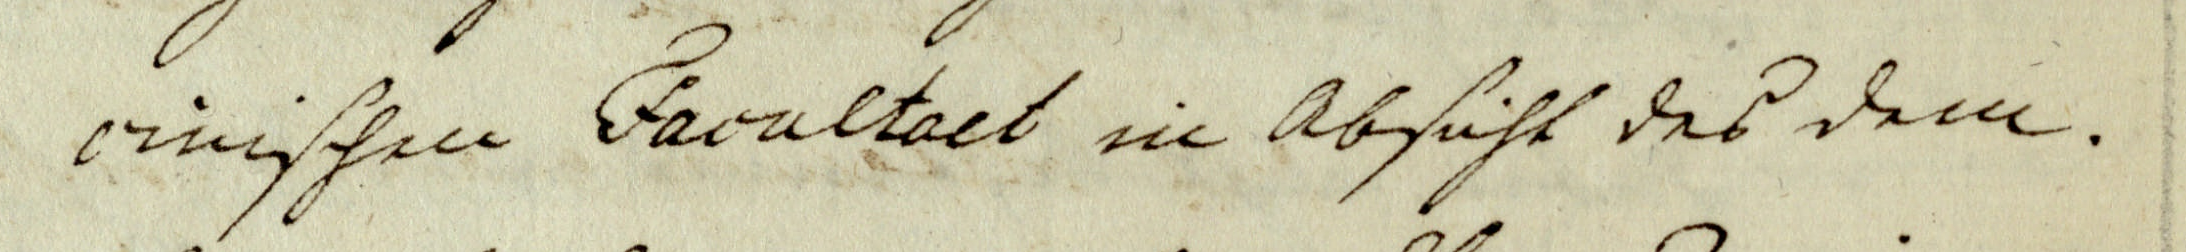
cinischen Facultaet in Absicht des dem¬
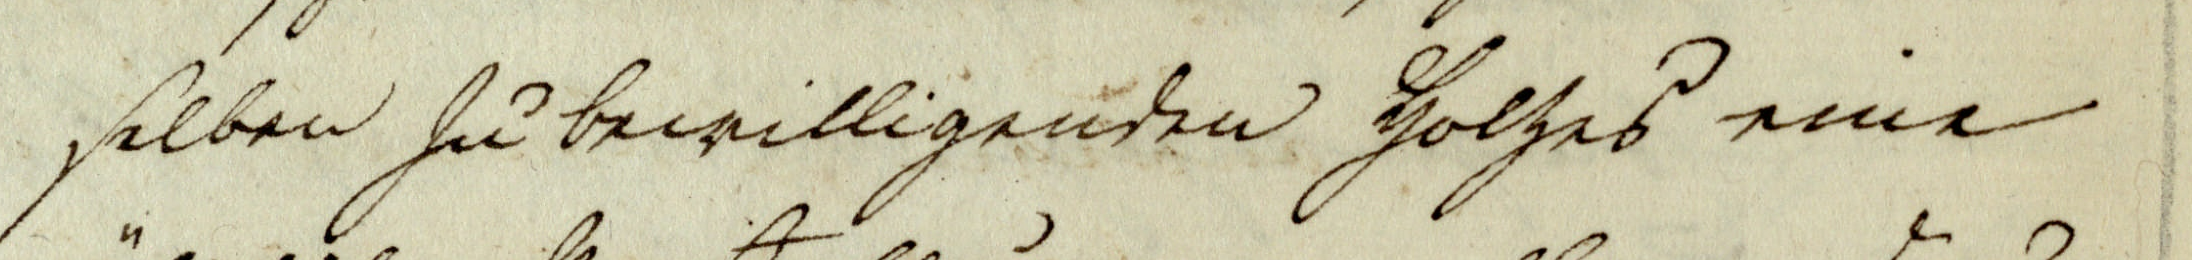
selben zu bewilligenden Holzes eine
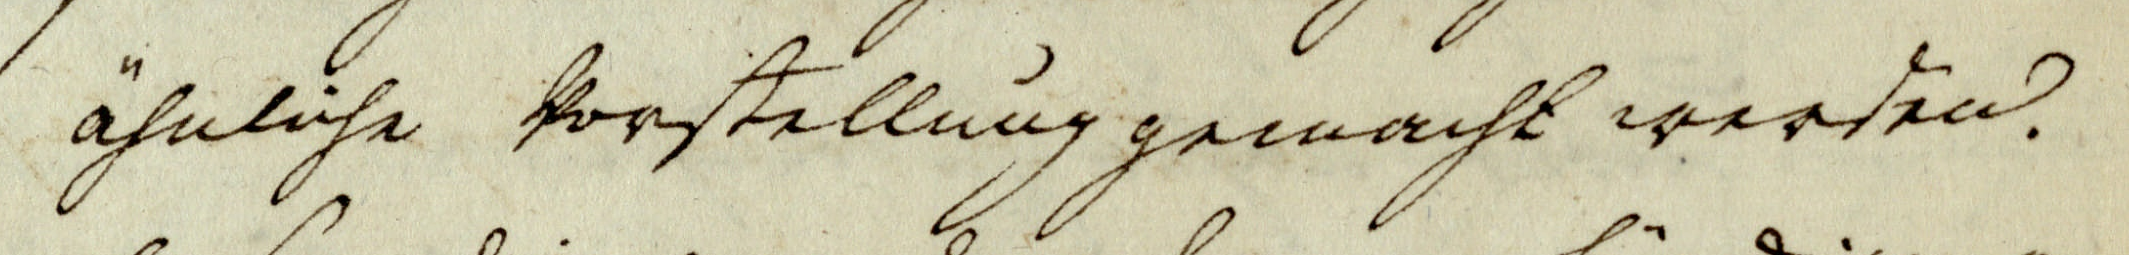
ähnliche Vorstellung gemacht werden.
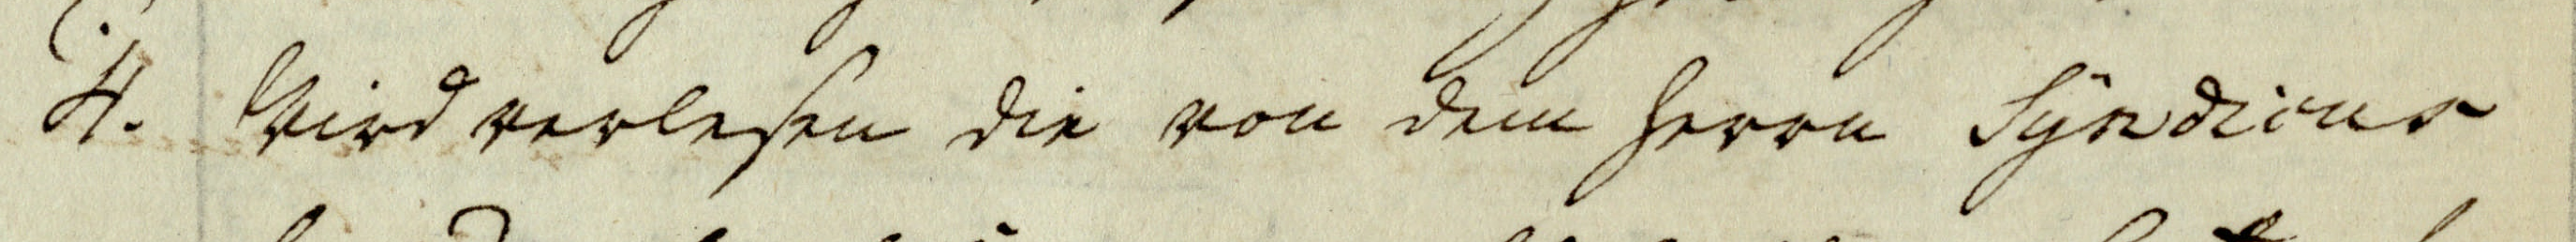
4. Wird verlesen die von dem Herrn Sÿndicus
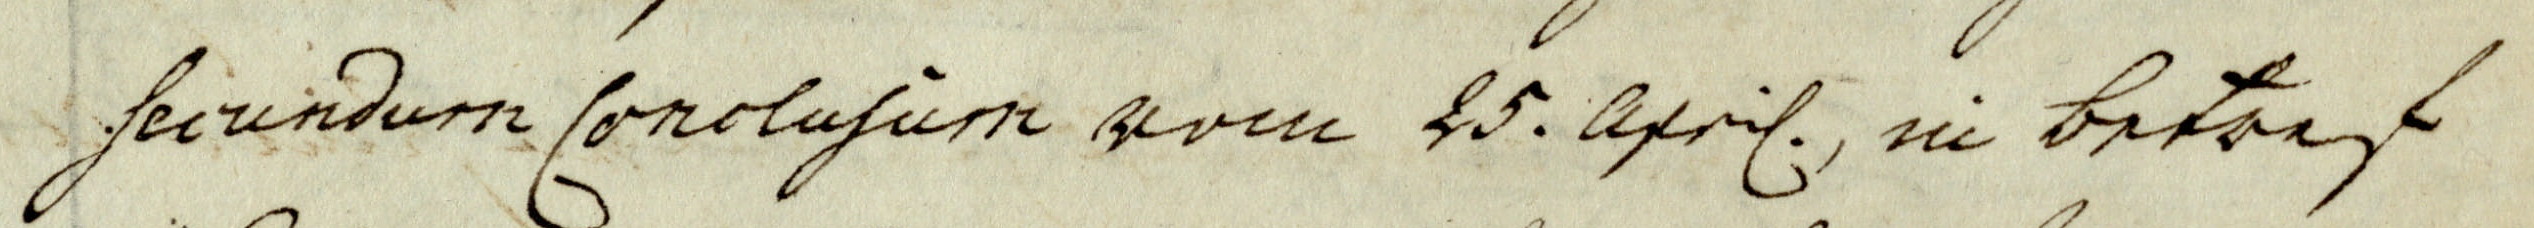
secundum Conclusum vom 25. April., in Betref
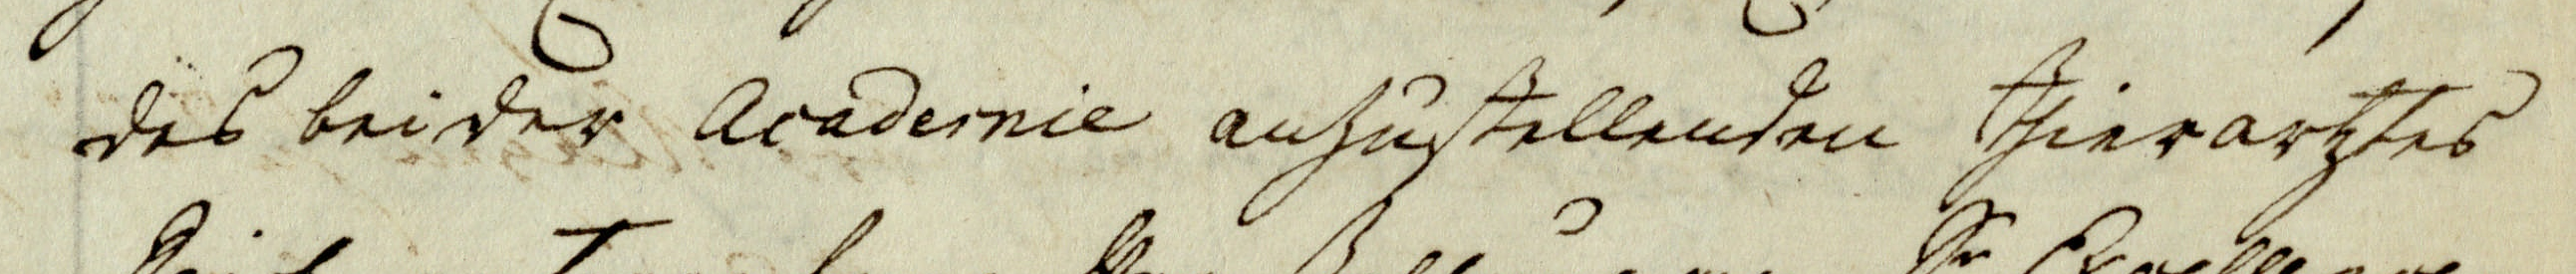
des bei der Academie anzustellenden Thierartztes
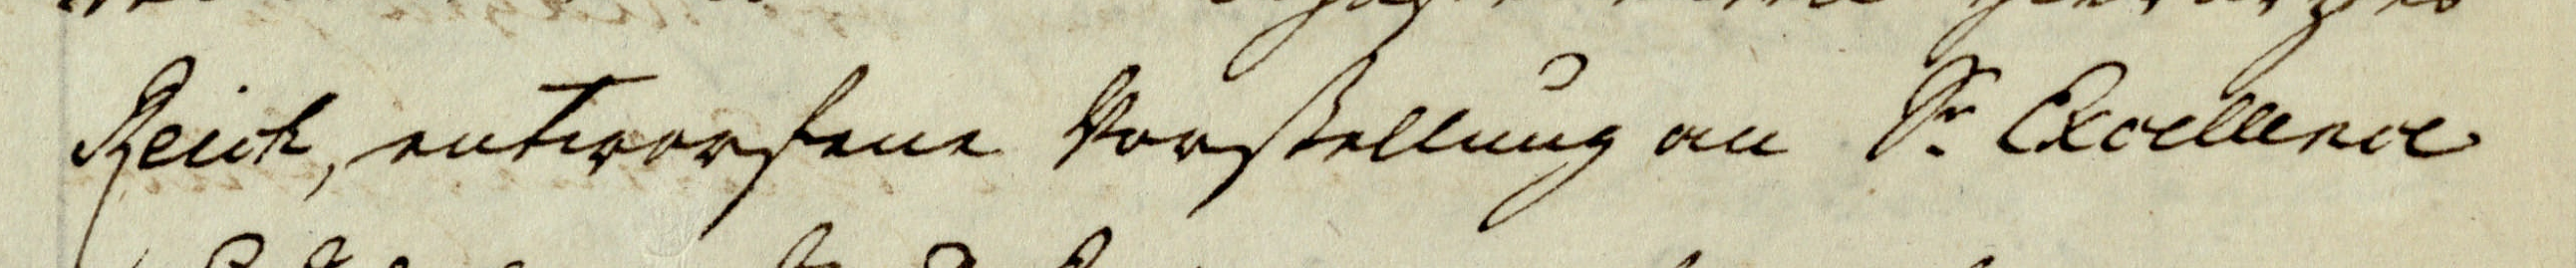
Reich, entworfene Vorstellung an Sr. Excellence
